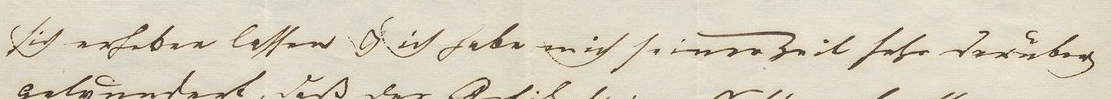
sich erheben lassen & ich habe mich seiner Zeit sehr darüber
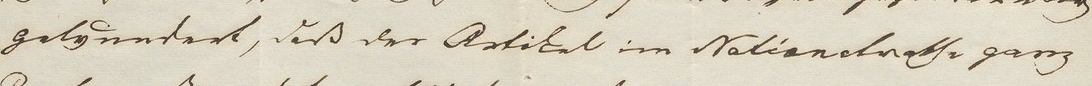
gewundert, daß der Artikel im Nationalrathe ganz
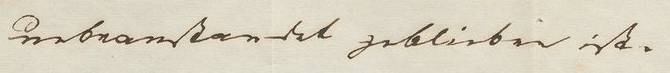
unbeanstandet geblieben ist.
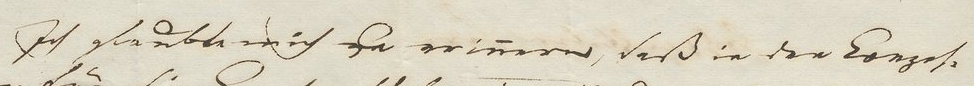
Ich glaubte mich zu erinnern, daß in den Conzes-
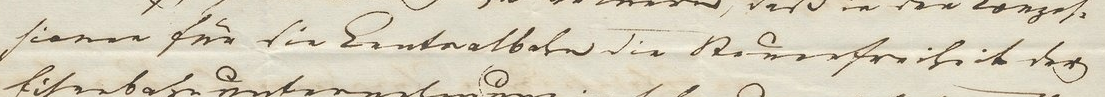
sionen für die Centralbahn die Steuerfreiheit der
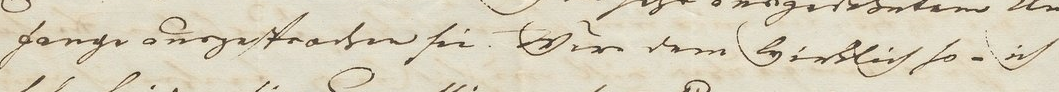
fange ausgesprochen sei. Wäre dem wirklich so – ich
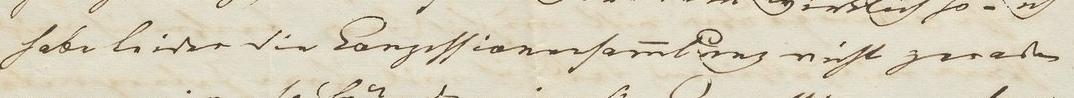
habe leider die Conzessionensammlung nicht gerade
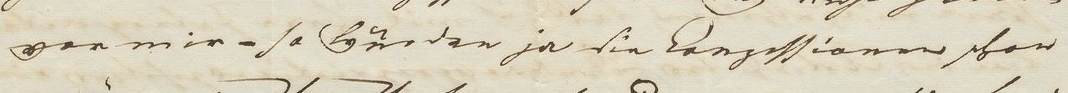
vor mir – so würden ja die Conzessionen schon
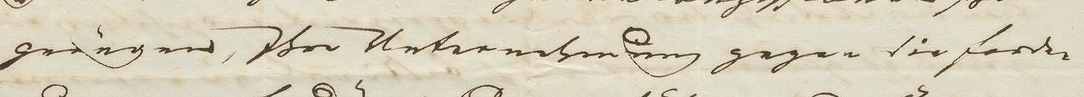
genügen, Ihre Unternehmung gegen die Forde-
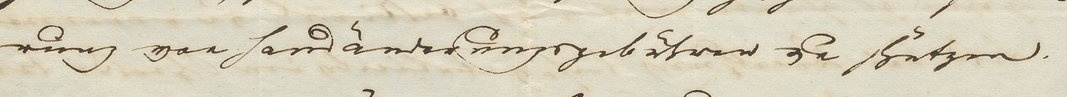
rung vor Handänderungsgebühren zu schützen.
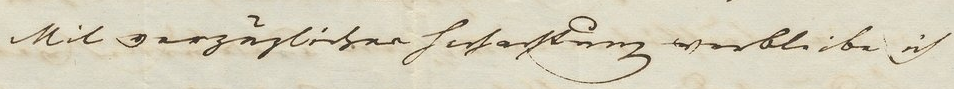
Mit vorzüglicher Hochachtung verbleibe ich
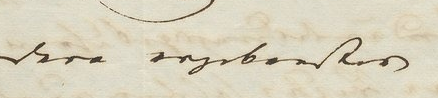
Dero ergebenster
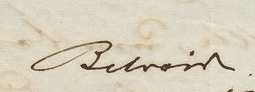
Belvoir
